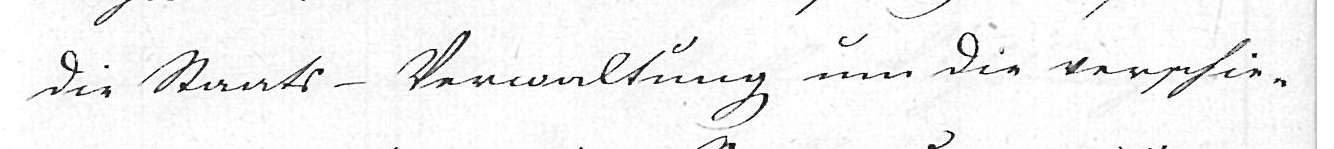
die Staats-Verwaltung um die verschie-
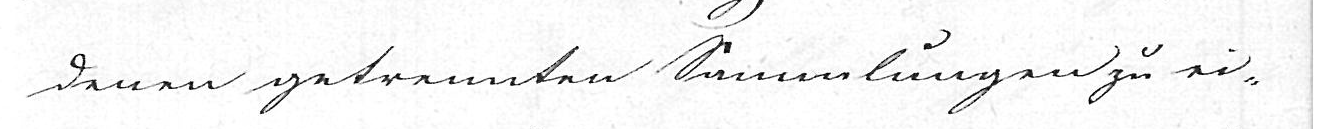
denen getrennten Sammlungen zu ei-
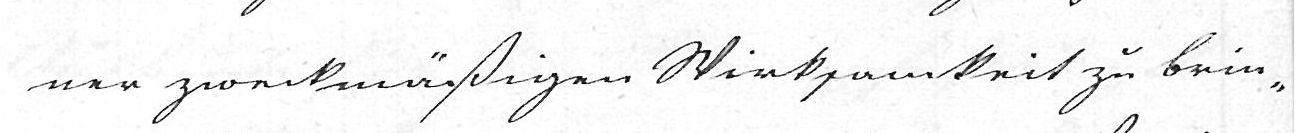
ner zweckmäßigen Wirksamkeit zu brin-
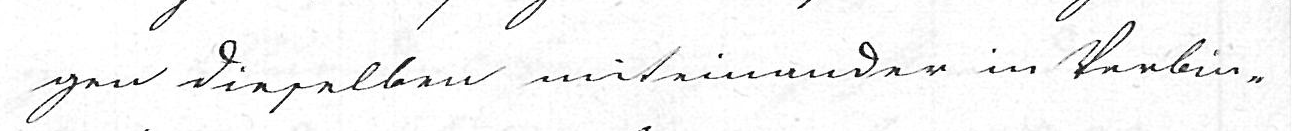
gen dieselben miteinander in Verbin-
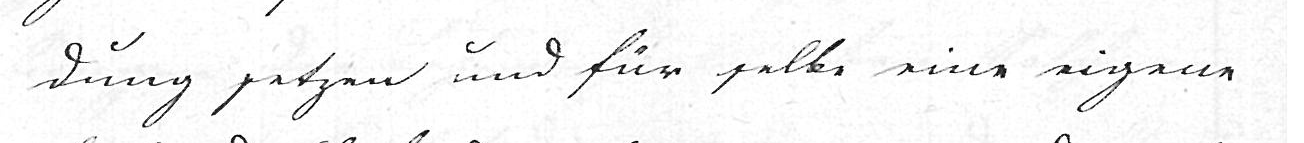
dung setzen und für selbe eine eigene
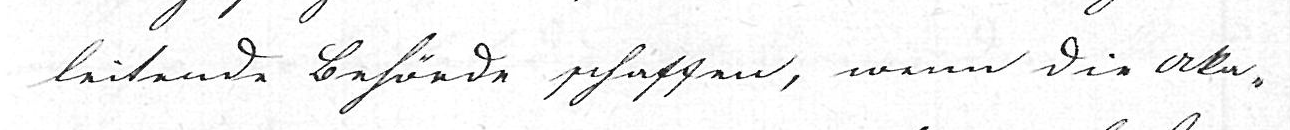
leitende Behörde schaffen, wenn die Aka-
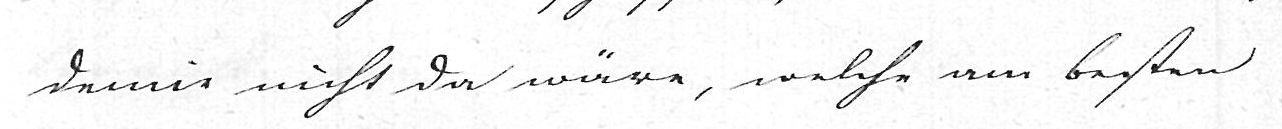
demie nicht da wäre, welche am besten
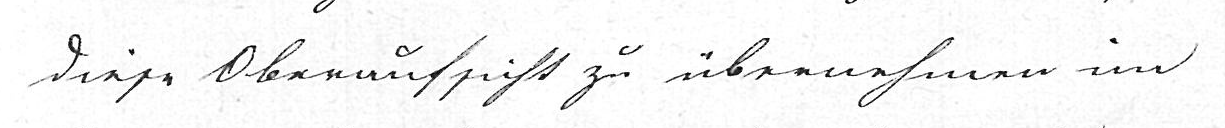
diese Oberaufsicht zu übernehmen im
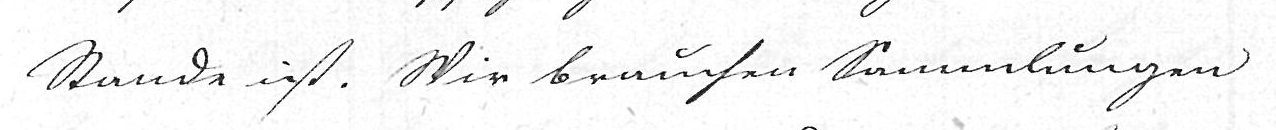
Stande ist. Wir brauchen Sammlungen
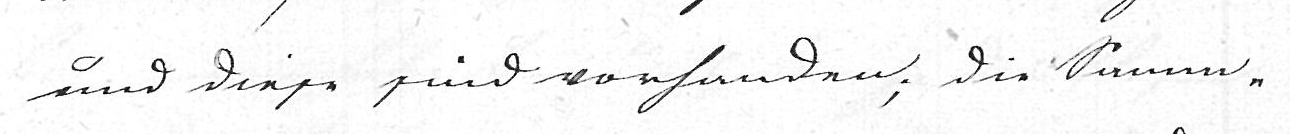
und diese sind vorhanden; die Samm-
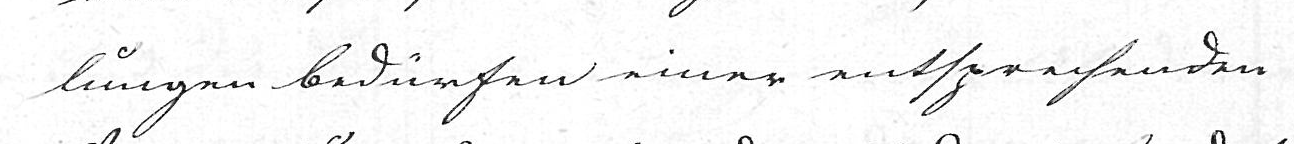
lungen bedürfen einer entsprechenden
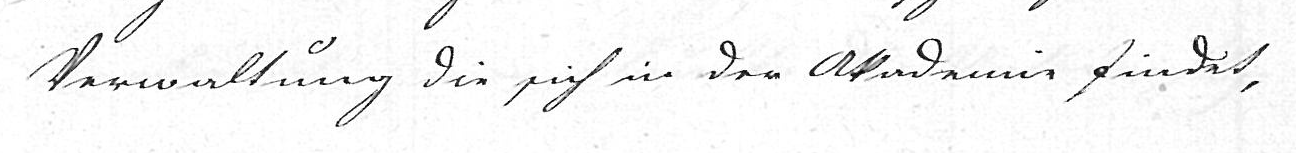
Verwaltung die sich in der Akademie findet,
